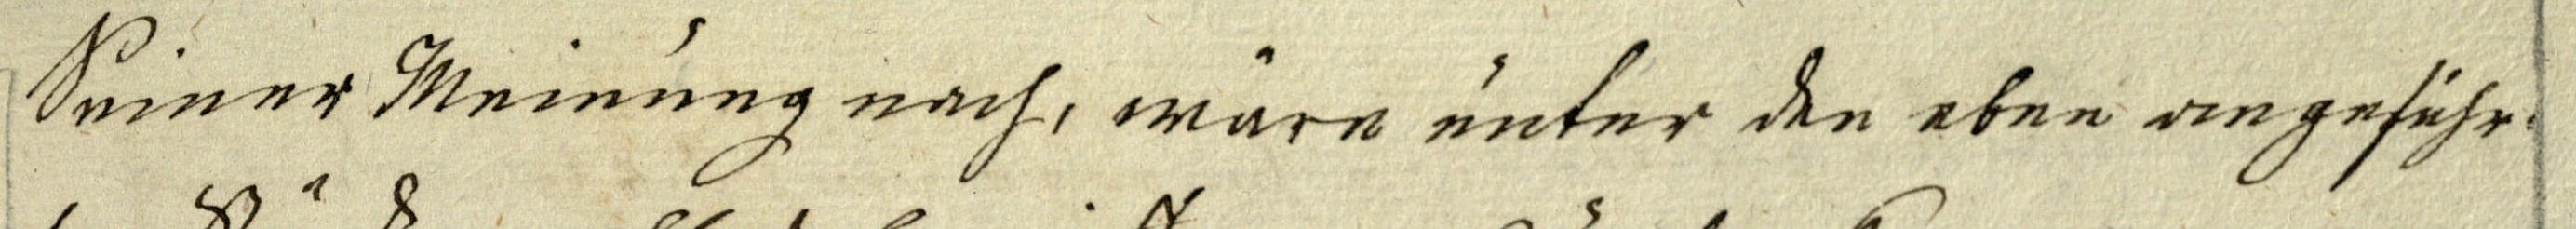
Seiner Meinung nach, wäre unter den eben angeführ¬
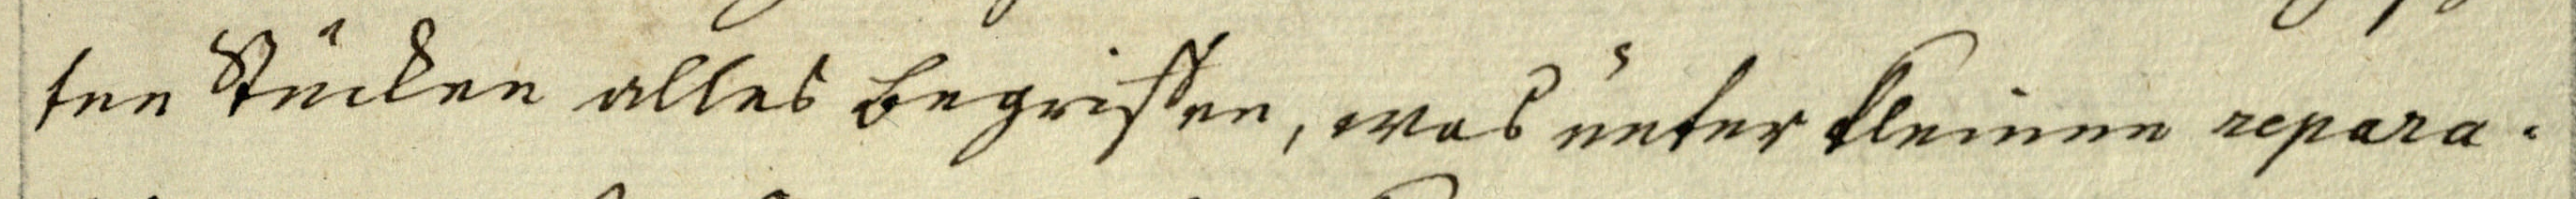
ten Stücken alles begriffen, was unter kleinen repara¬
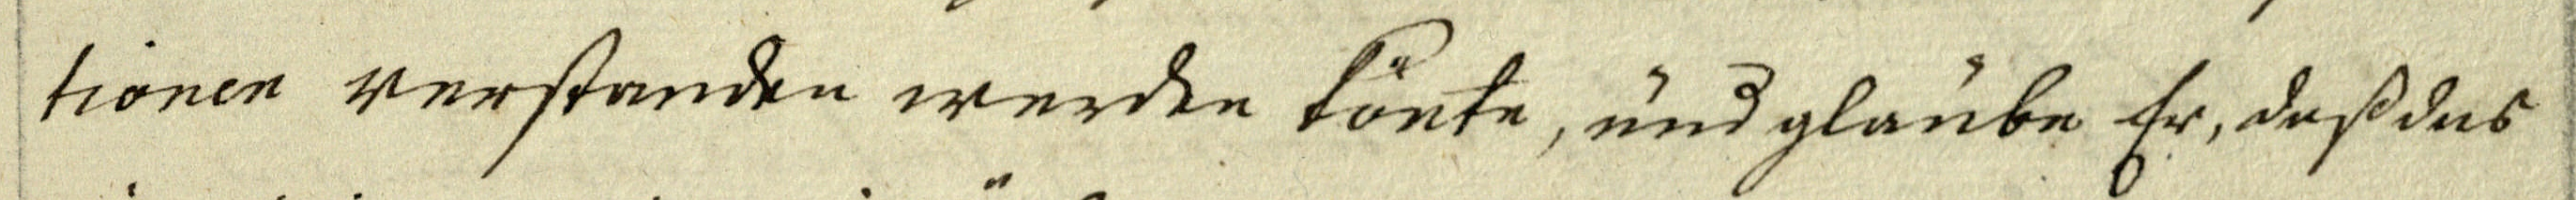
tionen verstanden werden könte, und glaube Er, daß das
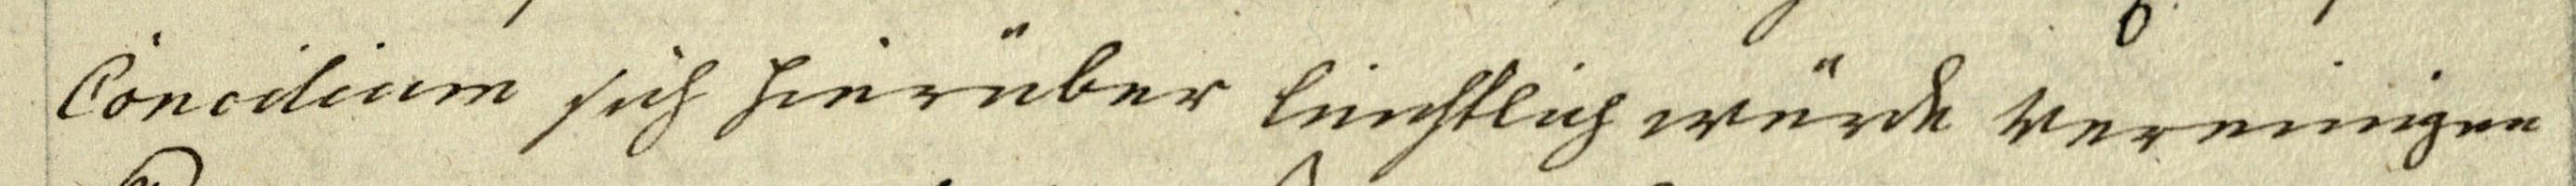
Concilium sich hierüber leichtlich würde vereinigen
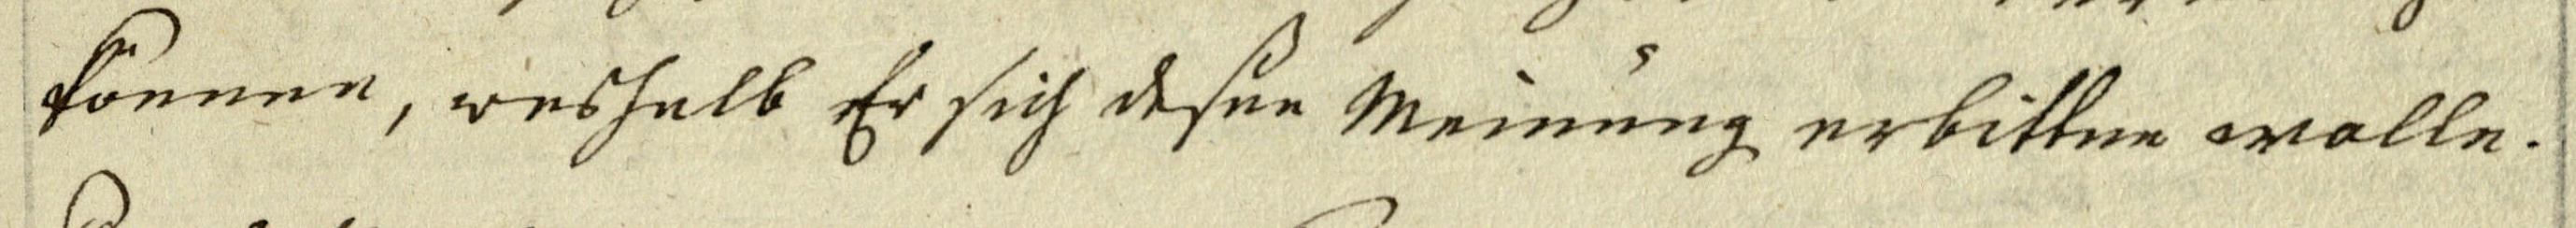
können, weshalb Er sich deßen Meinung erbitten wolle.
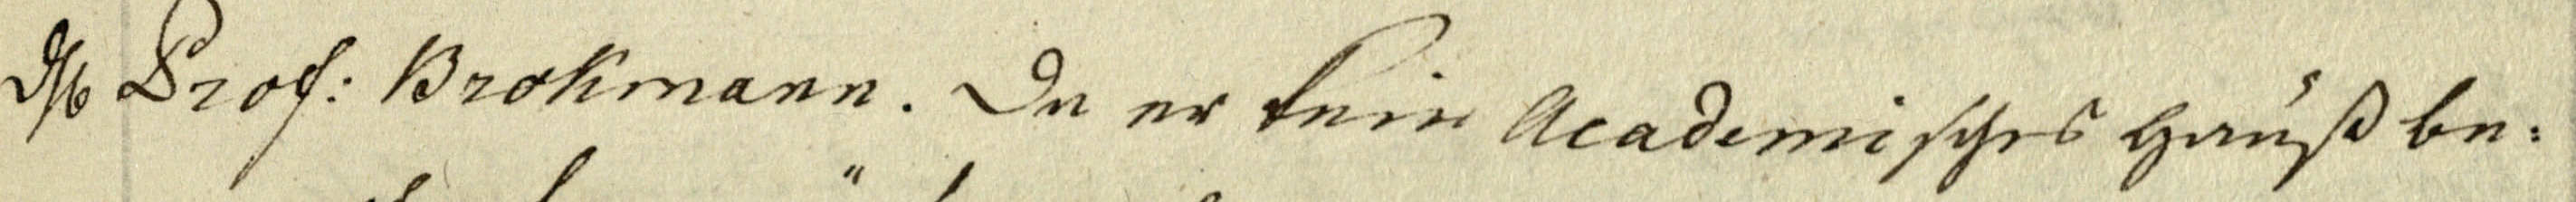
dh. Prof. Brokmann. Da er kein Academisches Hauß be¬
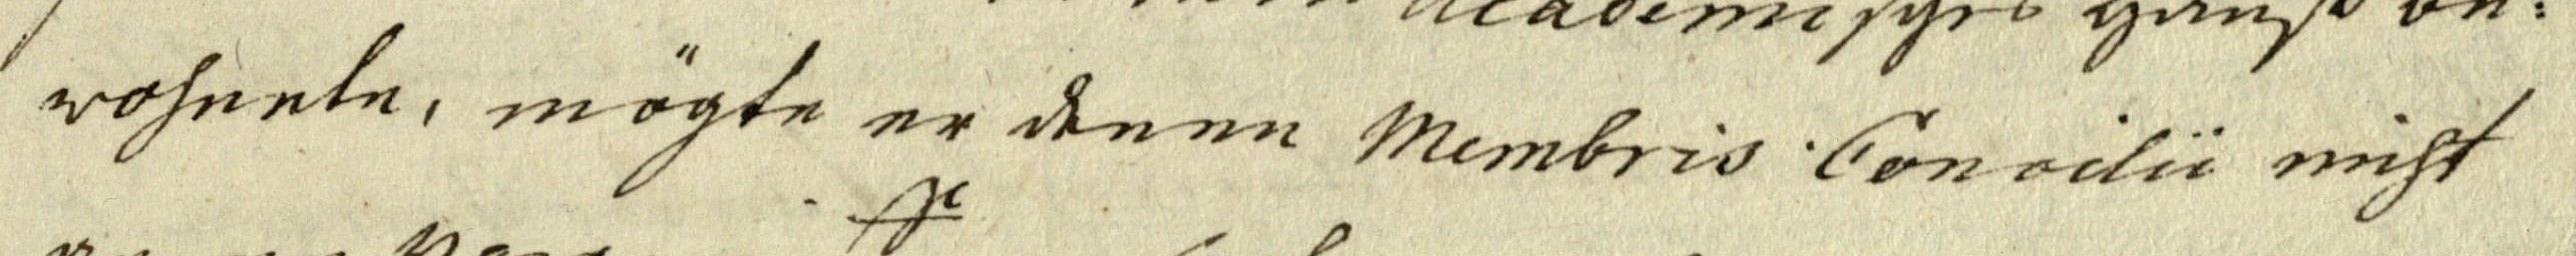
wohnete, mögte er denen Membris Concilii nicht
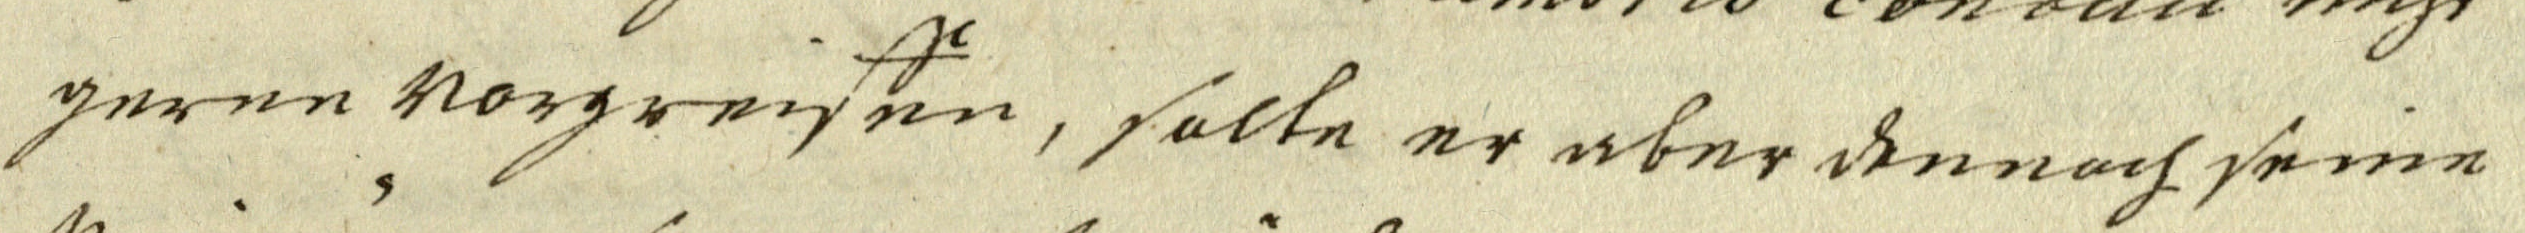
gerne vorgreiffen, solte er aber dennoch seine
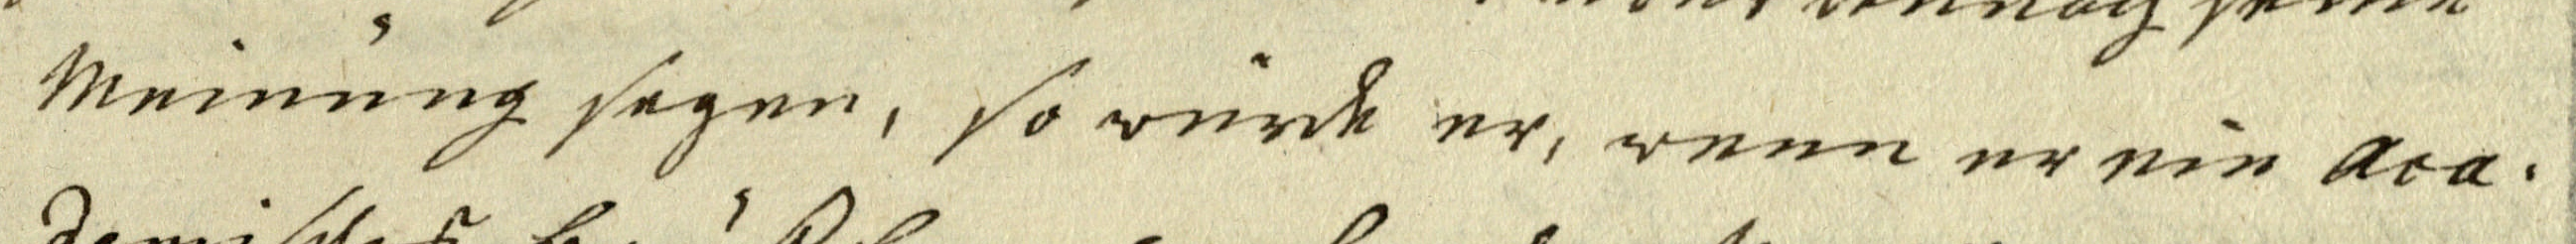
Meinung sagen, so würde er, wenn er ein Aca¬
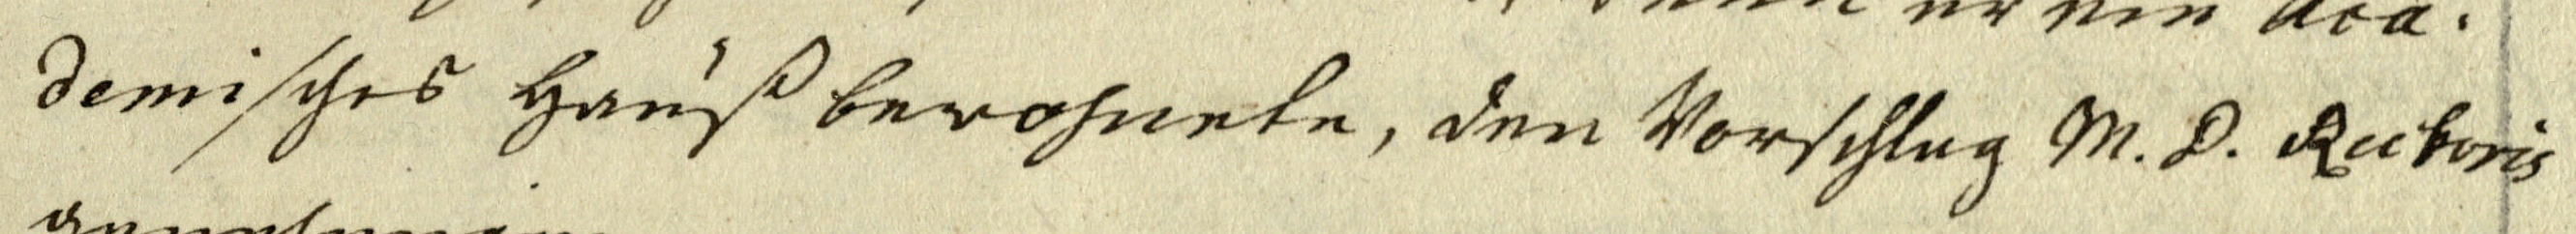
demisches Haus bewohnete, den Vorschlag M. D. Rectoris
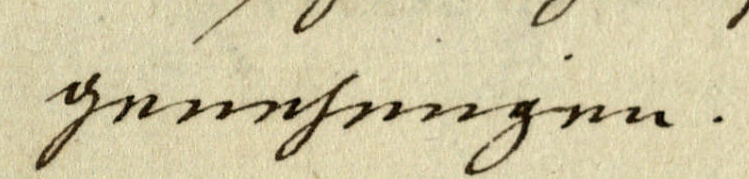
genehmigen.
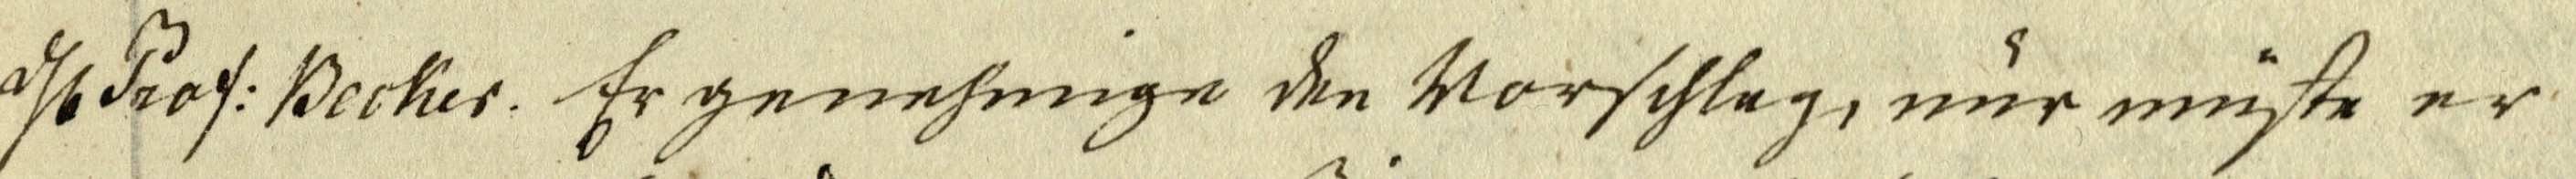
dh. Prof. Becker. Er genehmige den Vorschlag, nur müste er
